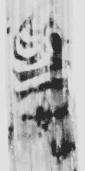{爲心}
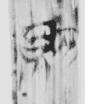則
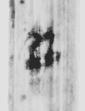身
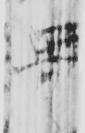長
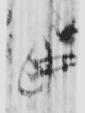母
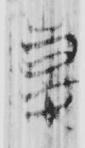𢝫
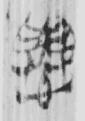{與心}
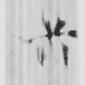必
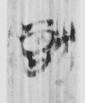{言沒}
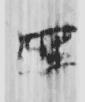聖
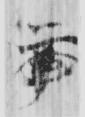{亓子}
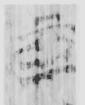亞
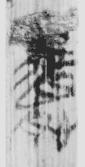慮
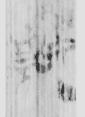{女𡵂}
